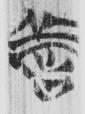善
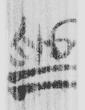爲
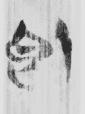飤
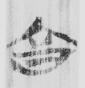亯
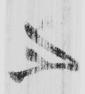之
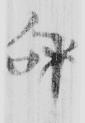和
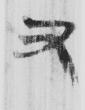又
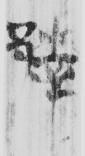{邑木辛}
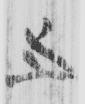之
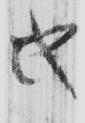女
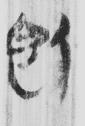飤
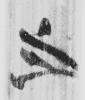之
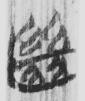㡭
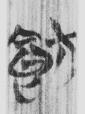{食方}
